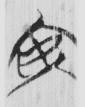安
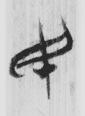民
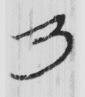乃
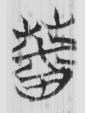蕃
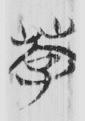{艹字}
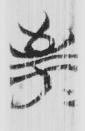{至于}=
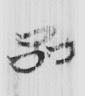厽
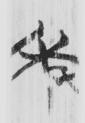年
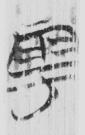𩁹
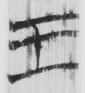王
